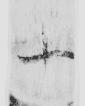七
